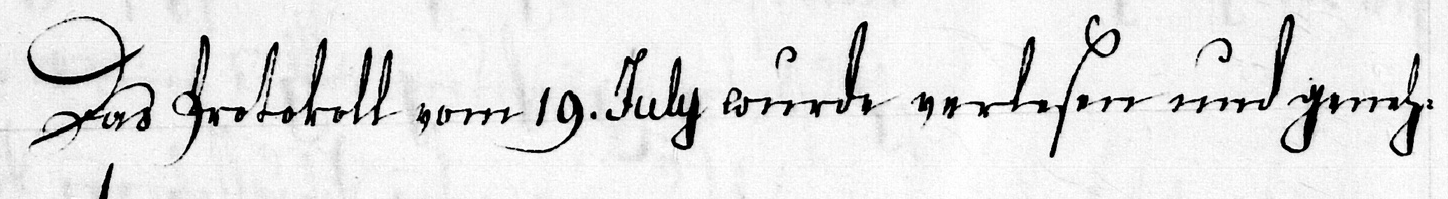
Das Protokoll vom 19. July wurde verlesen und geneh¬
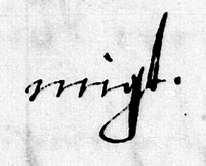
migt.
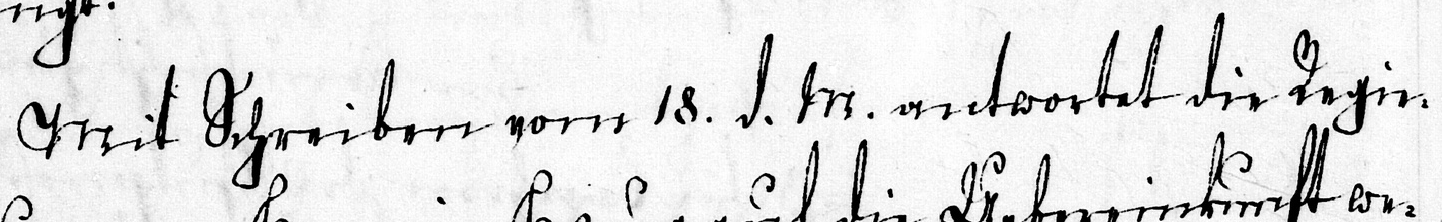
Mit Schreiben vom 18. d. M. antwortet die Regie¬
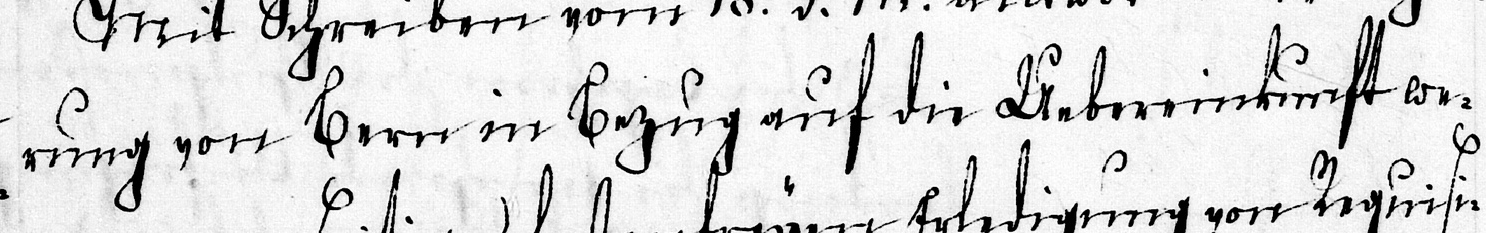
rung von Bern in Bezug auf die Uebereinkunft we¬
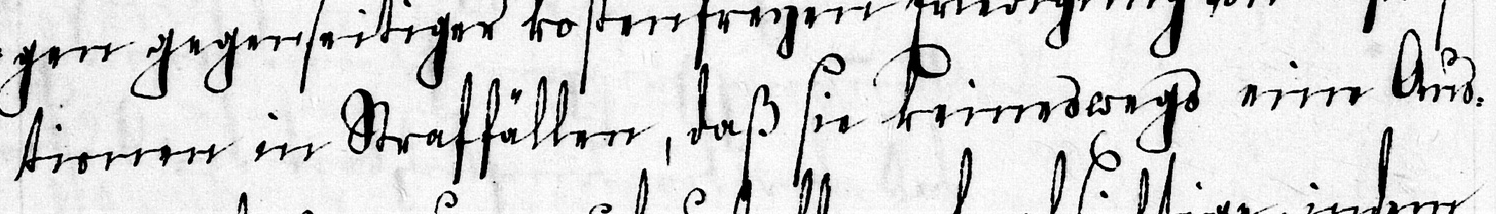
rien in Straffällen, daß sie keineswegs eine Aus¬
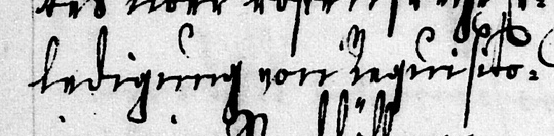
ledigung von Requisito¬
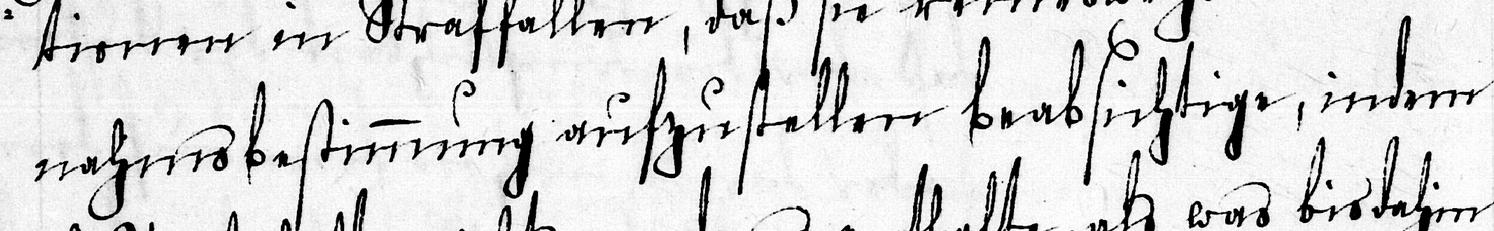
nahmsbestimmung aufzustellen beabsichtige, indem
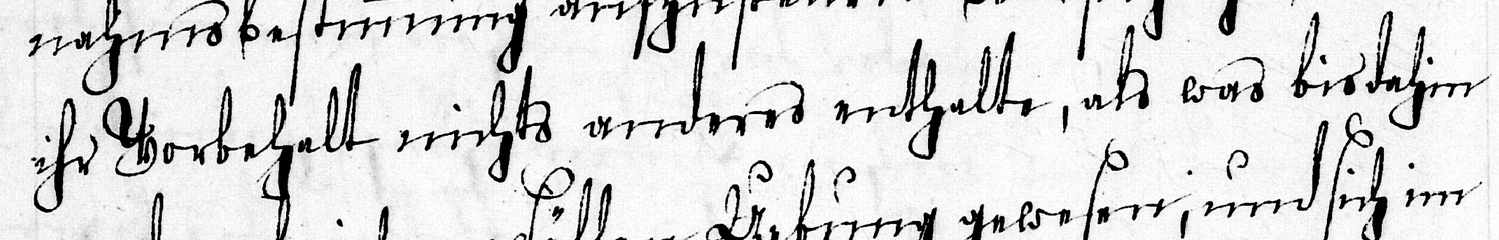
ihr Vorbehalt nichts anderes enthalte, als was bis dahin
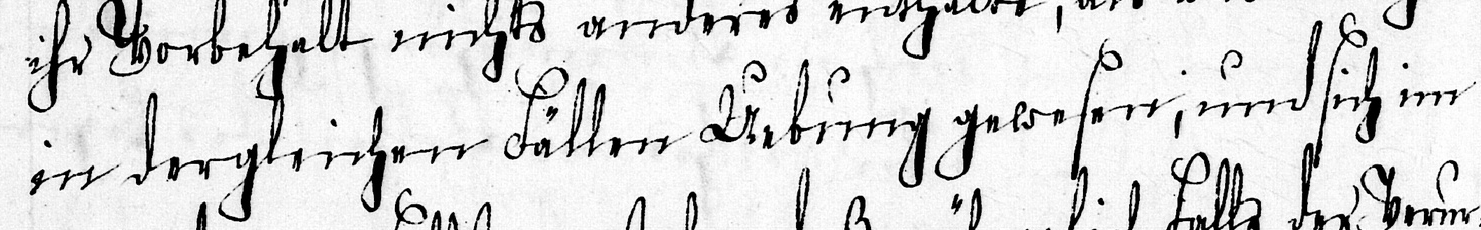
in dergleichen Fällen Uebung gewesen, und sich im
